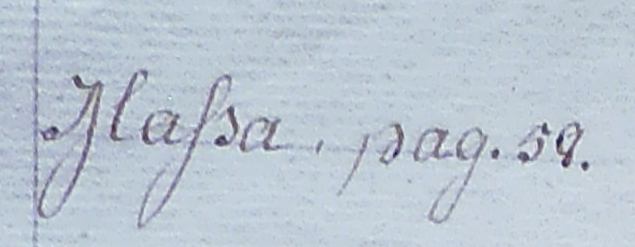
Massa, pag. 59.
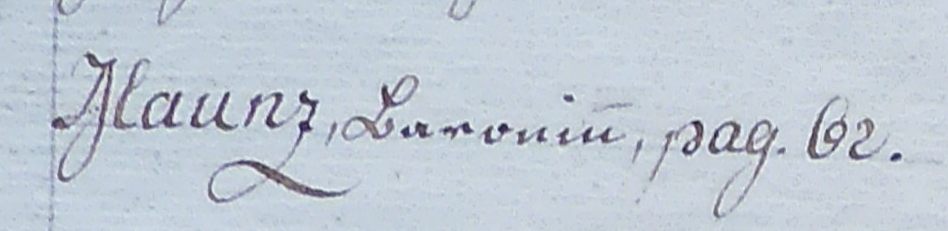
Maunz, Baronin̅, pag. 62.
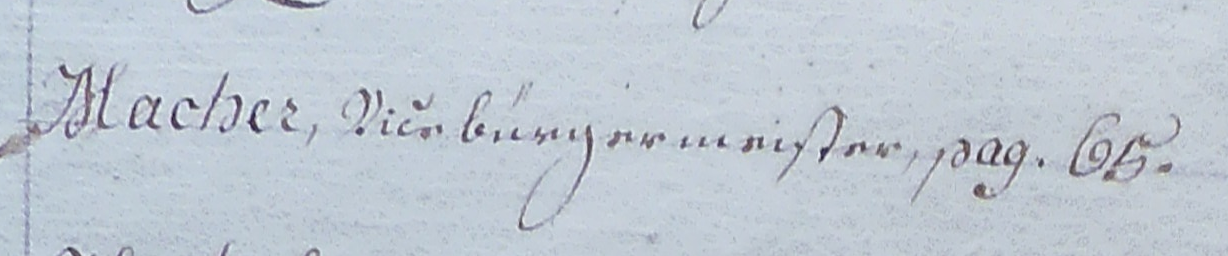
Macher, Vicebürgermeister, pag. 65.
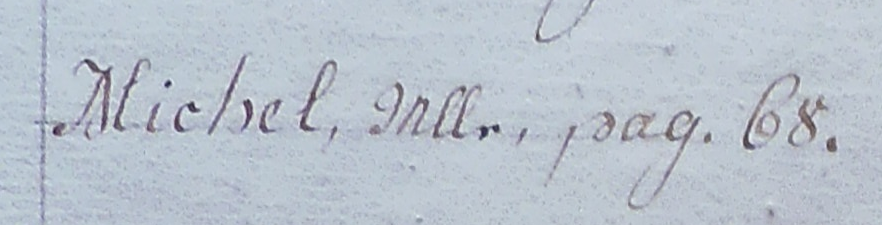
Michel, Mlle, pag. 68.
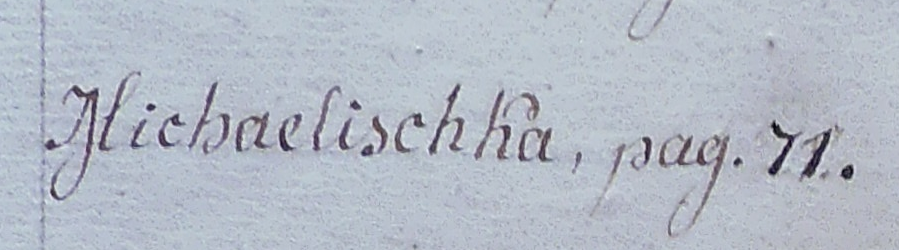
Michaelischka, pag. 71.
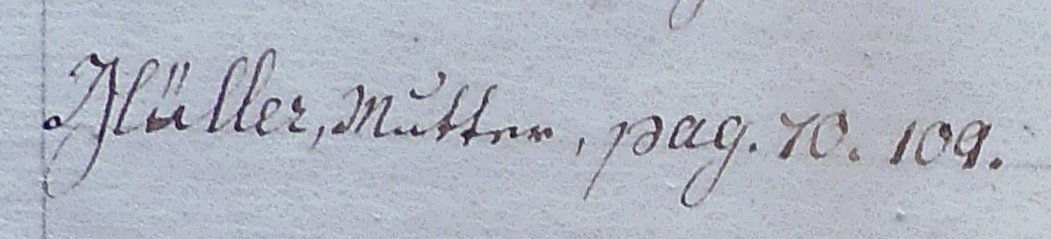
Müller, Mutter, pag. 70. 109.
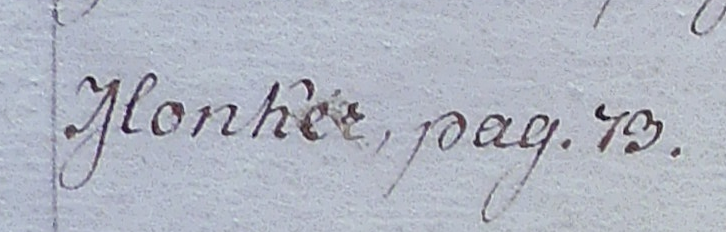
Monker, pag. 73.
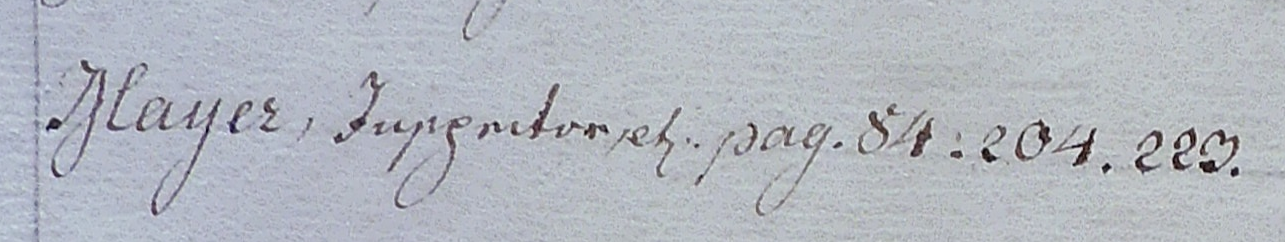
Mayer, Inspector, etz. pag. 84. 204. 223.
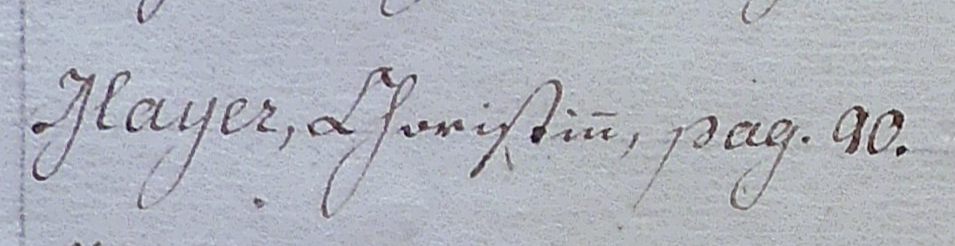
Mayer, Choristin̅, pag. 90.
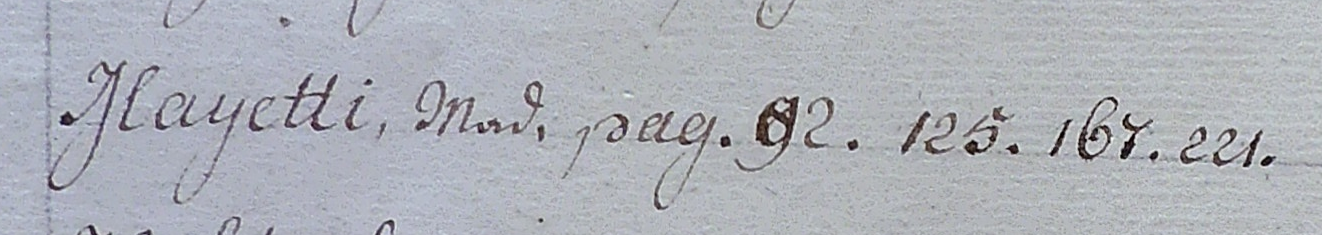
Mayetti, Mad. pag. 92. 125. 167. 221.
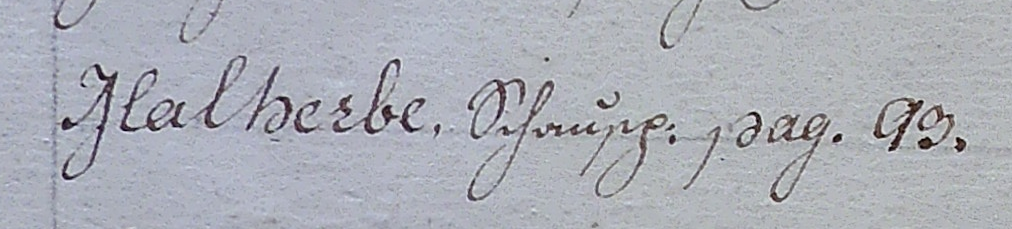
Malherbe, Schausp: pag. 93.
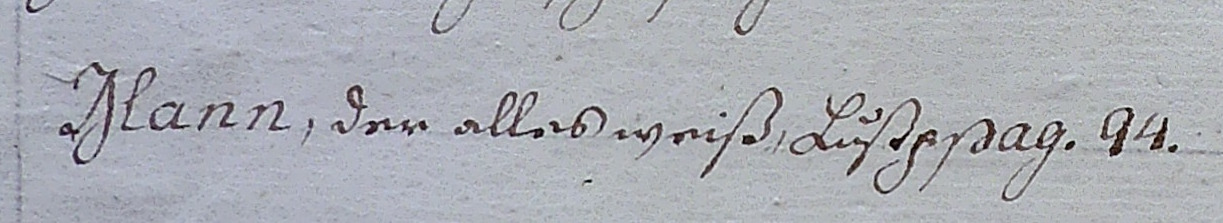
Mann, der alles weiß, Lustp. pag. 94.
